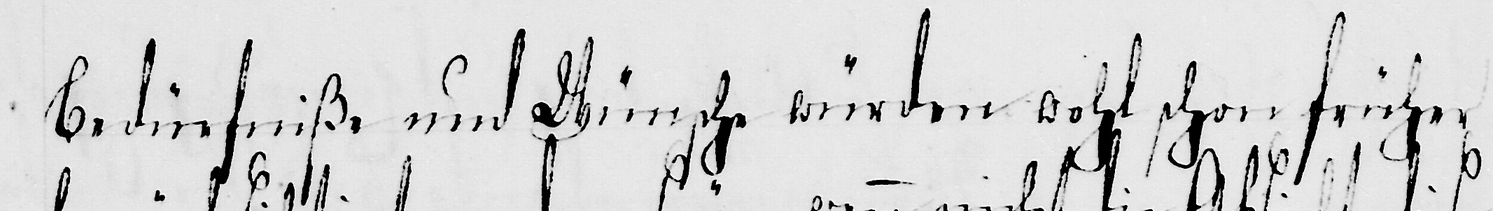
Bedürfniße und Wünsche würden wohl schon früher
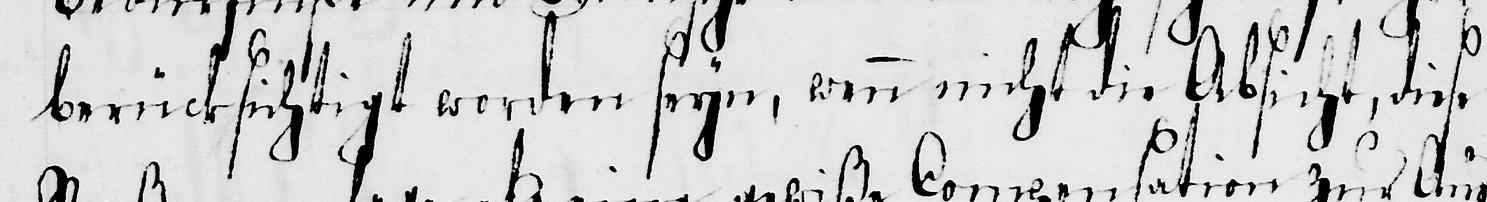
berücksichtigt worden seyn, wenn nicht die Absicht, diese
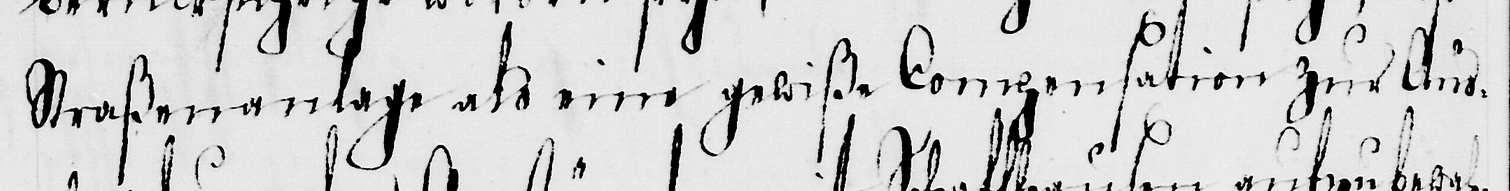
Straßenanlage als eine gewiße Compensation zur Aus¬
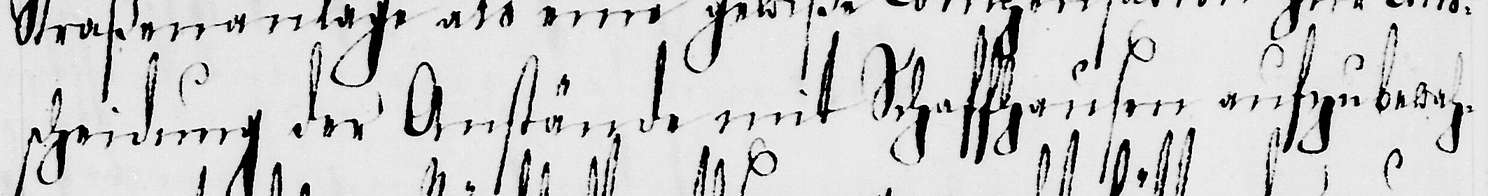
scheidung der Anstände mit Schaffhausen aufzubewah¬
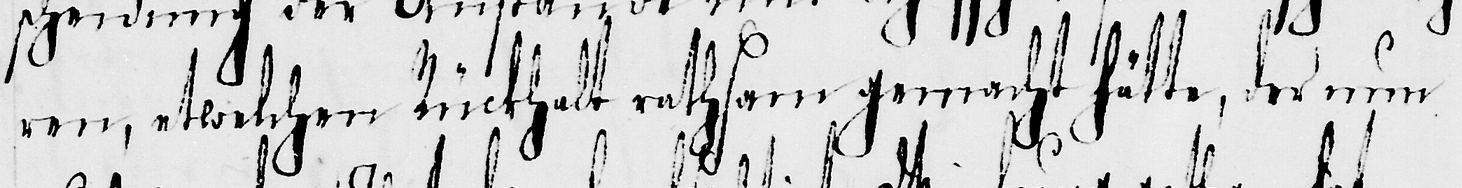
ren, etwelchen Rückhalt rathsam gemacht hätte, der nun
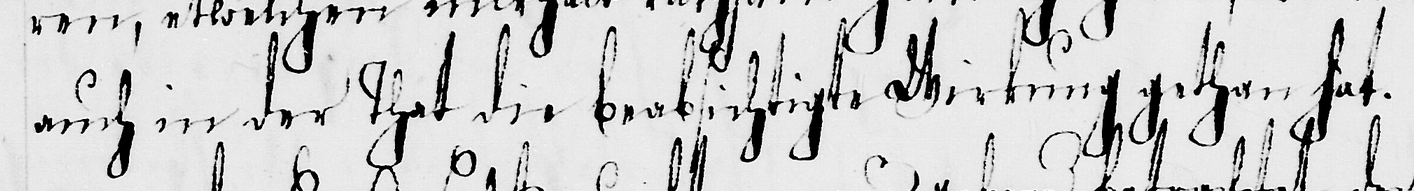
auch in der That die beabsichtigte Wirkung gethan hat.
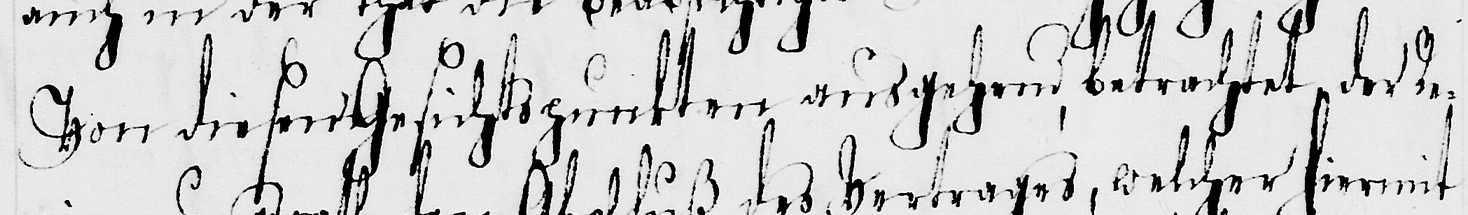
Von diesen Gesichtspunkten ausgehend, betrachtet der R¬
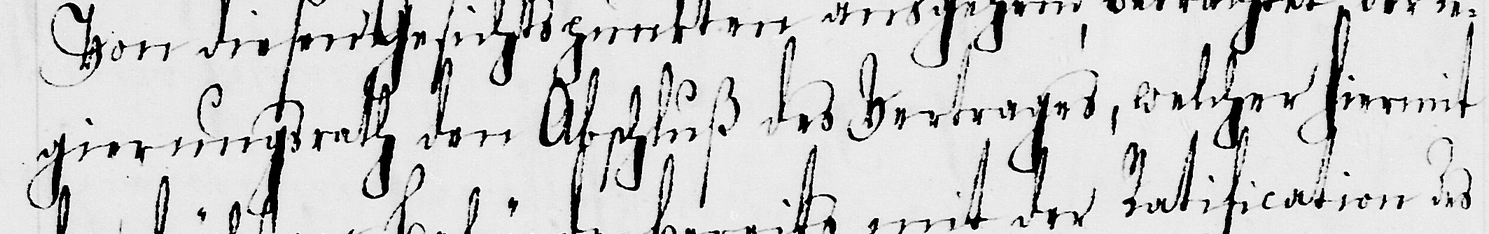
egierungsrath den Abschluß des Vertrages, welcher hiermit
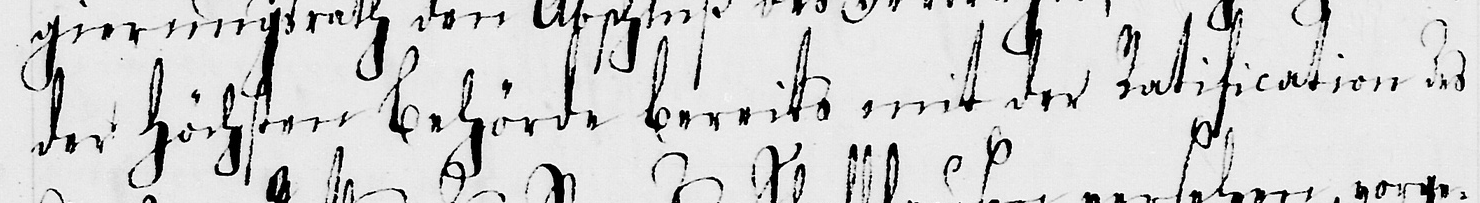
der höchsten Behörde bereits mit der Ratification des
